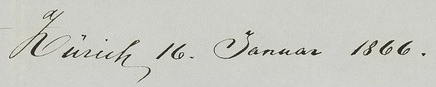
Zürich, 16. Januar 1866.
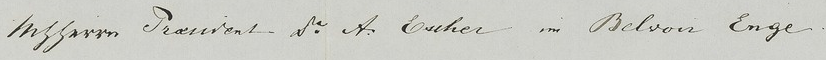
MHHerrn Praesident Dr A. Escher im Belvoir Enge.
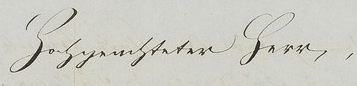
Hochgeachteter Herr,
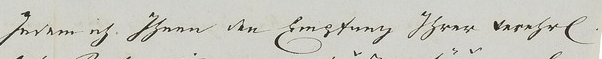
Indem ich Ihnen den Empfang Ihrer verehrl.
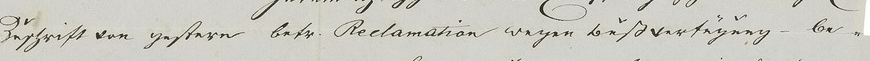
Zuschrift von gestern betr. Reclamation wegen Bußverfügung be-
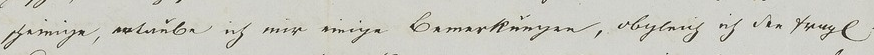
scheinige, erlaube ich mir einige Bemerkungen, obgleich ich den fragl.
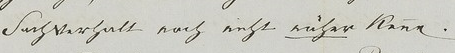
Sachverhalt noch nicht näher kenne.
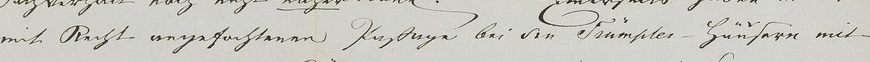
mit Recht angefochtenen Paßage bei den Trümpler-Häusern mit
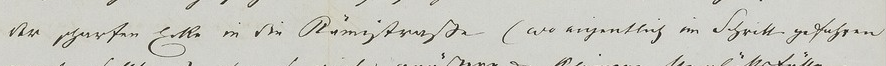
der scharfen Ecke in die Rämistraße (wo eigentlich im Schritt gefahren
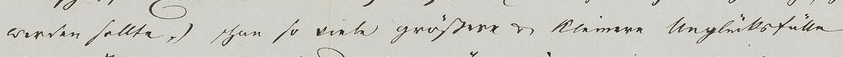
werden sollte) schon so viele größere & kleinere Unglücksfälle
